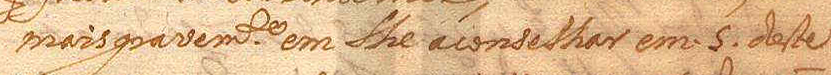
mais gravem.te em lhe aconselhar em .S. deste
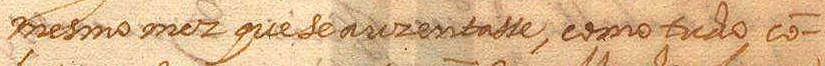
mesmo mez que se auzentasse, como tudo cō
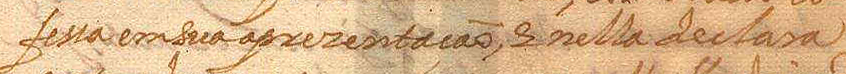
fessa em sua aprezentaçaõ, E nella declara
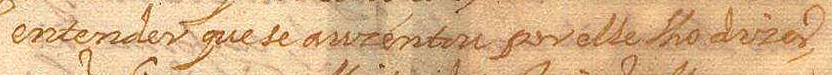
entender que se auzentou por elle lho dizer,
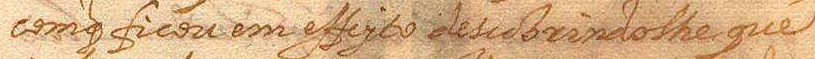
com q̄ ficou em effeyto descobrindolhe que
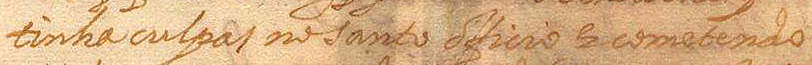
tinha culpas no santo officio E cometendo
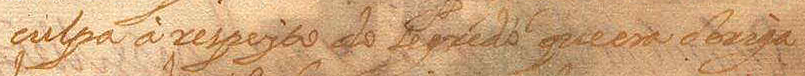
culpa a respeyto do segredo que era obriga
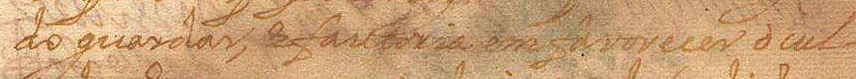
do guardar, E fautoria em favorecer o cul
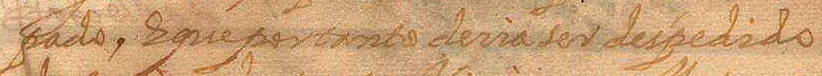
pado, E que portanto devia ser despedido
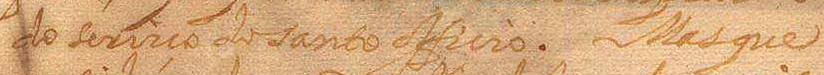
do serviço do santo officio. Mas que
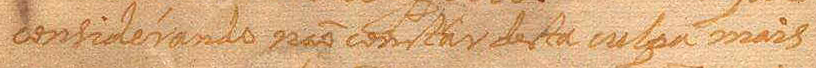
considerando naõ constar desta culpa mais
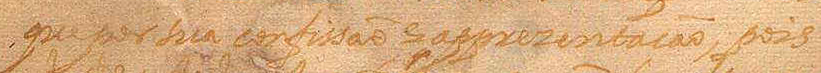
que por sua confissaõ E apprezentaçaõ, pois
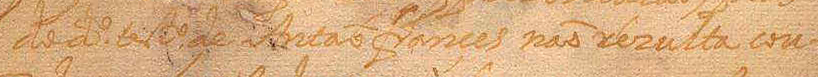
do d̄.o test.o de Antaõ frances naõ rezulta cou
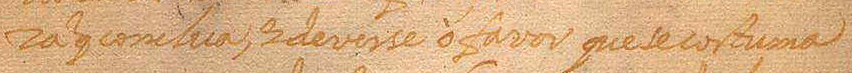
za q̄ conclua, E devesse o favor que se costuma
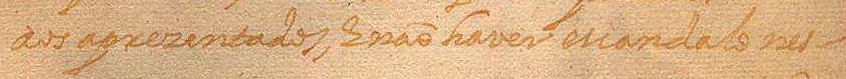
aos aprezentados, E naõ haver escandalo nes
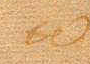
te
